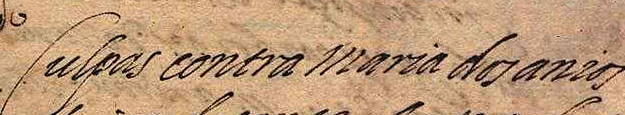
Culpas contra maria dos anios
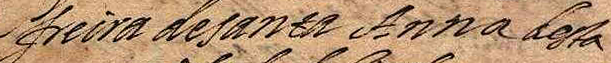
freira de santa Anna desta
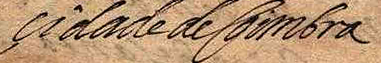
çidade de Coimbra
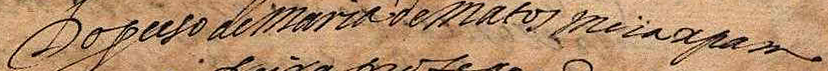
Do ꝓceso de maria de matos meia xpam
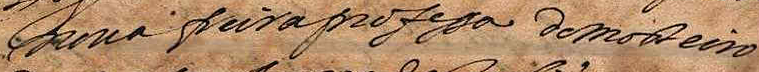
noua freira professa do mosteiro
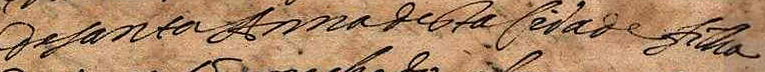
de santa Anna desta Cidade filha
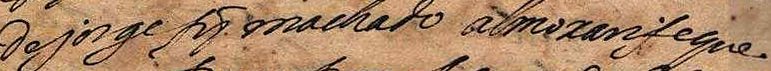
de jorge frz̅ machado almoxarife que
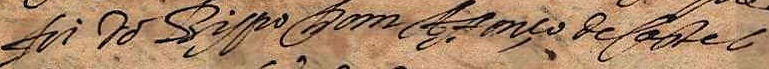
foi do Bispo Dom Affonço de Castel
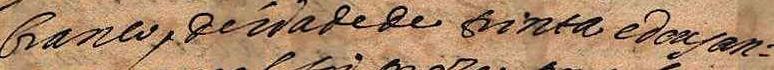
branco, de idade de trinta e dous an
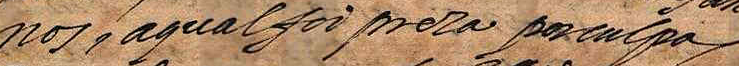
nos, a qual foi preza por culpas
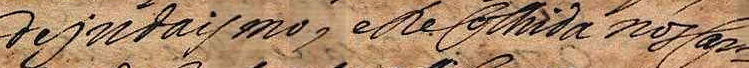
de judaismo, e Recolhida nos Car
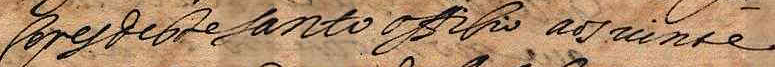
Ceres deste santo officio aos uinte
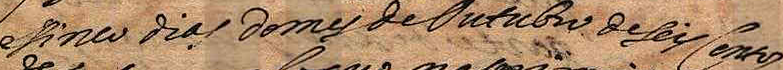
e sinco dias do mes de Outubro de seisCentos
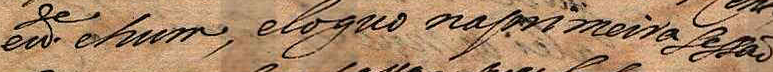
e ute. e hum, e loguo na primeira sessão
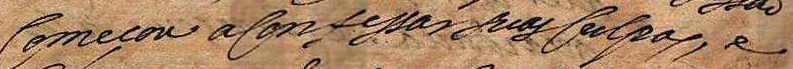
Começou a Confessar suas Culpas, e
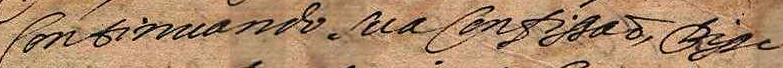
Continuando sua Confissão, Disse
